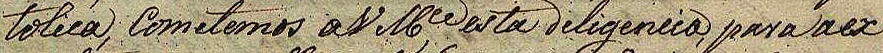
tolica, cometemos a V M,ce esta deligencia, para a ex
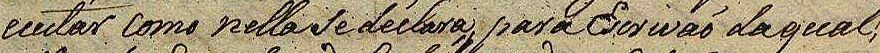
ecutar como nella se declara, para Escrivaõ da qual;
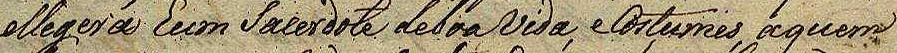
ellegerá hum sacerdote de boa vida, e costumes, a quem
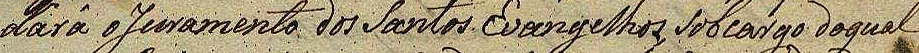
dará Juramento dos Santos Evangelhoz, sob cargo do qual
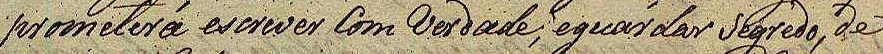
prometerá escrever com verdade, e guardar segredo, de
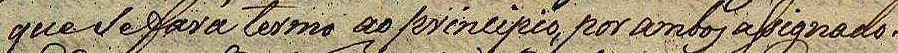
que se fará termo ao principio, por ambos assignado.
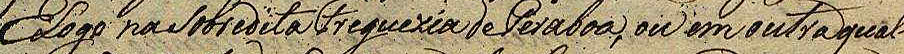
E logo na sobredita Freguezia de Peraboa, ou em outra qual
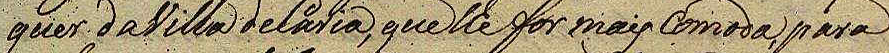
quer da Villa de Caria, que lhe for mais comoda, para
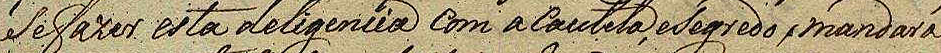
se fazer esta deligencia com a cautela e segredo, mandará
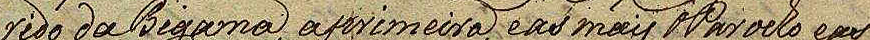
rido da Bigama, a primeira, e as mais o Parocho, e as
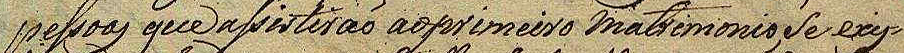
pessoas que assistiraõ ao primeiro matrimonio, se exis
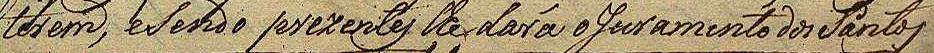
tirem, e sendo prezentes lhe dará o Juramento dos Santos
